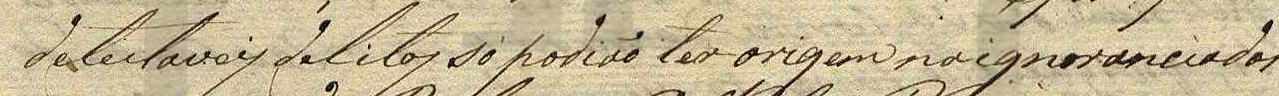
detestaveis delitos só podiaõ ter origem na ignorancia dos
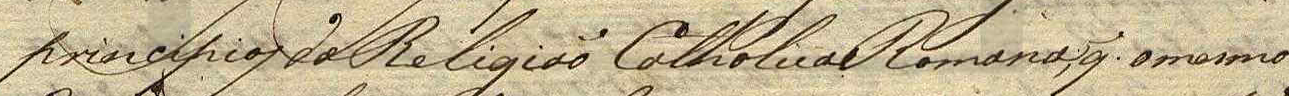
principios da Religiaõ Catholica Romana, q̄ o mesmo
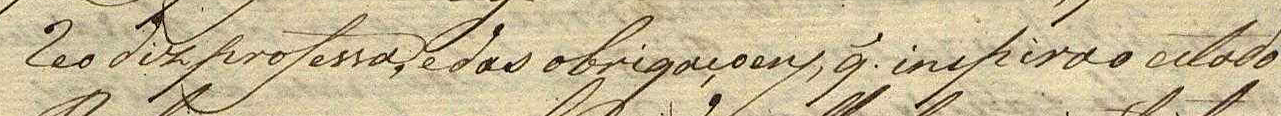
Reo diz professa, e das obrigaçoens, q̄ inspira o estado
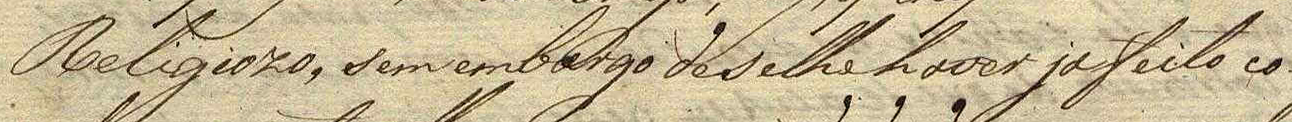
Religiozo, sem embargo de se lhe haver ja feito co
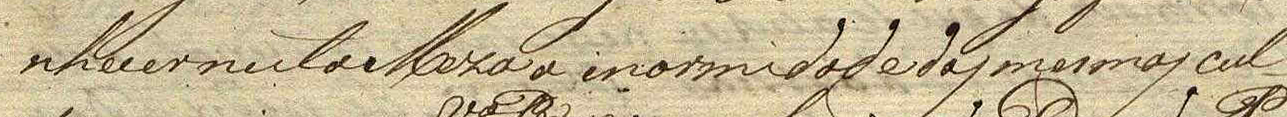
nhecer nesta Meza a inormidade das mesmas cul
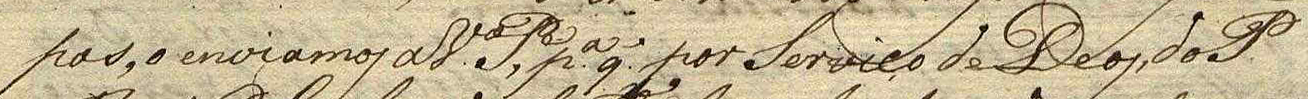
pas, o enviamos a V.a P.e p.a q̄ por Serviço de Deos, do P.
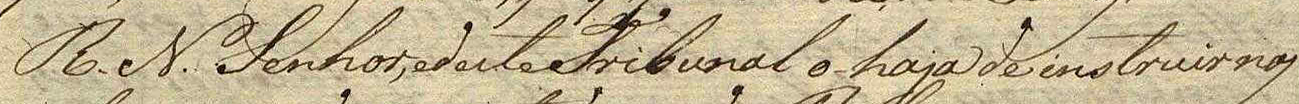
R. N. Senhor, e deste Tribunal o haja de instruir nas
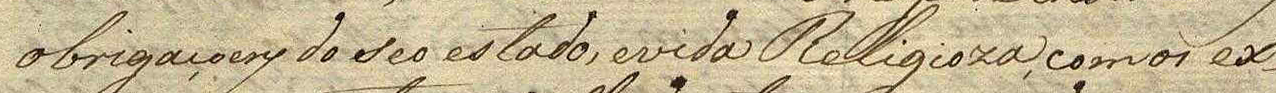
obrigaçoens do seo estado, e vida Religioza, com os ex
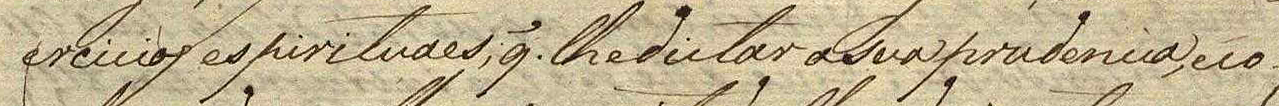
ercicios espirituaes, q̄ lhe dictar a sua prudencia, e co
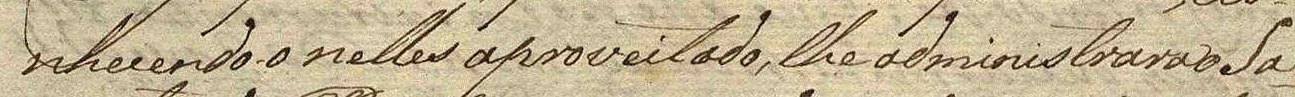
nhecendo-o nelles aproveitado, lhe administrara o Sa
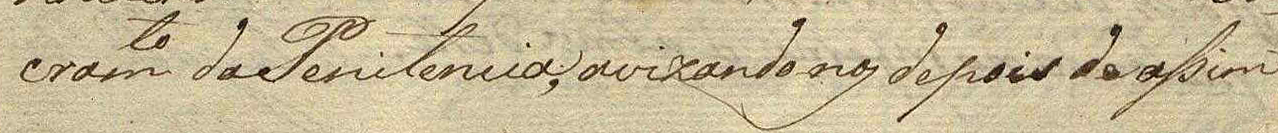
cram.to da Penitencia, avizando-nos depois de assim
